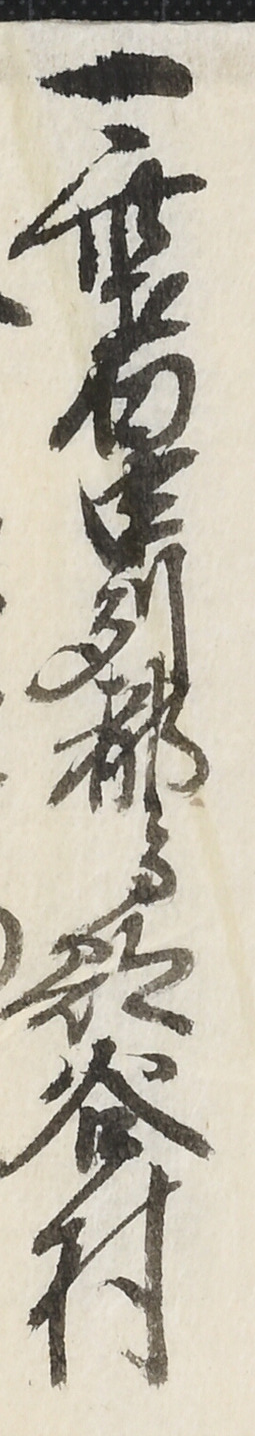一此者甲州都留郡谷村
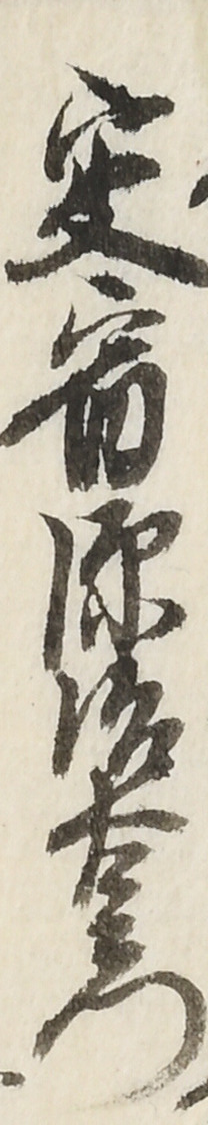定宿源治右衛門

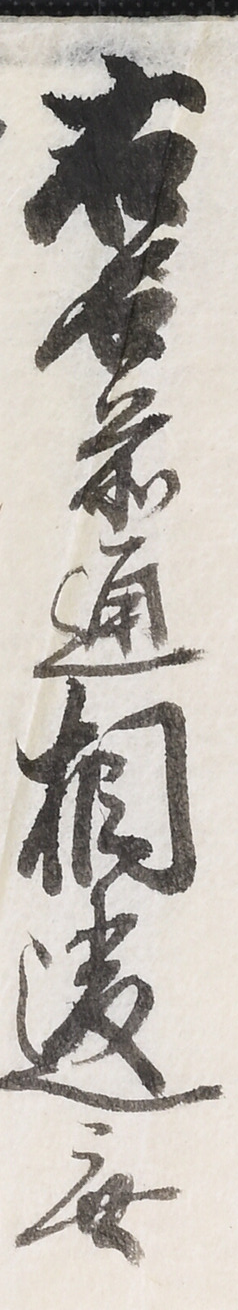右名前通相違無
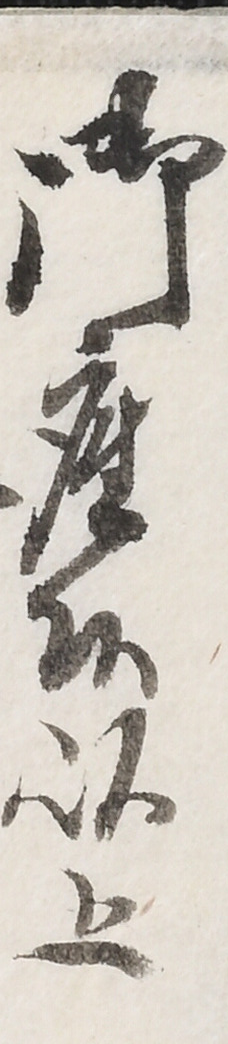御座候以上
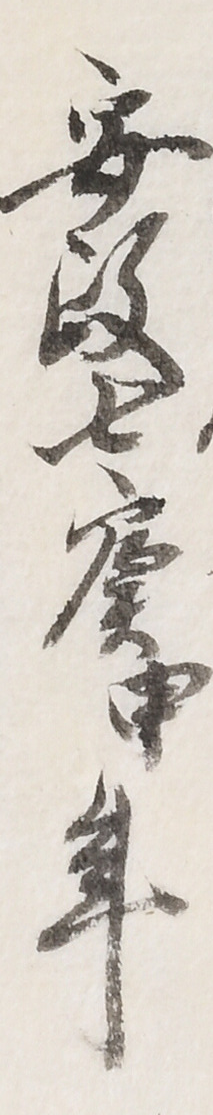安政七庚申年
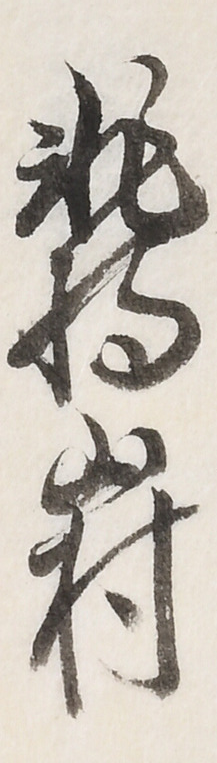非持山村
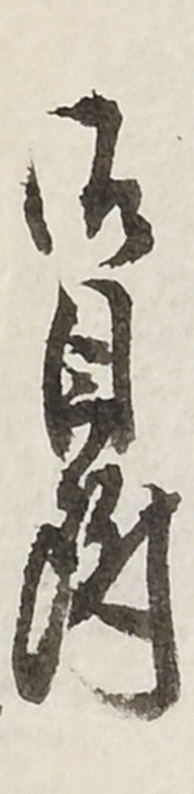御目附
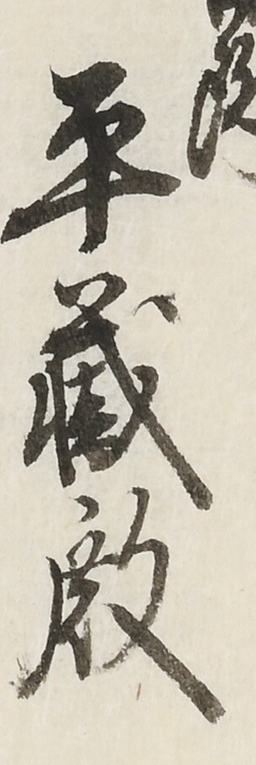平蔵殿
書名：安政七庚申年正月他国石切名前書上帳
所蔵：伊那市立高遠町図書館・合同会社AMANE
